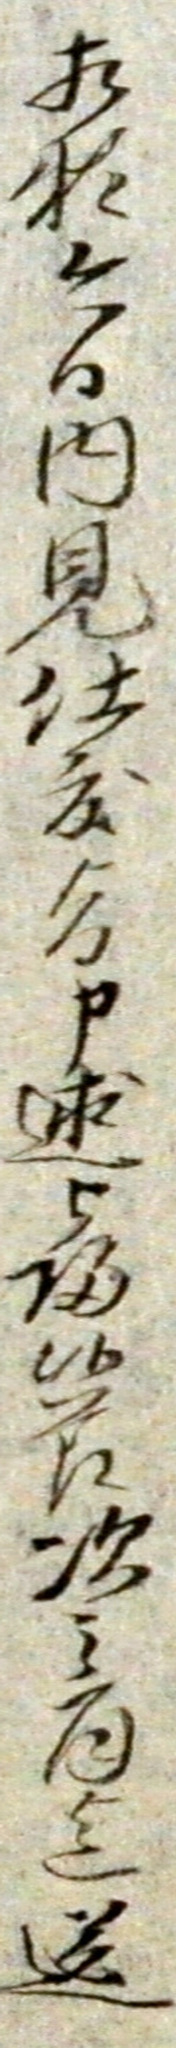相頼今日内見仕度旨申述ヒ帰候節次之間迄送
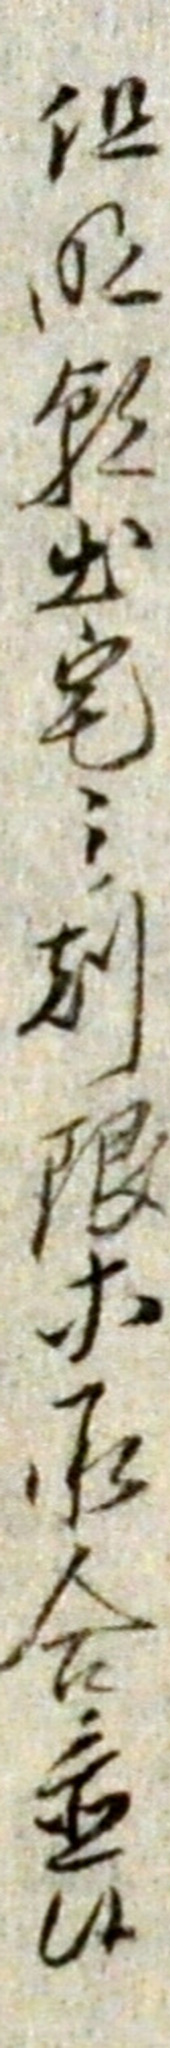但明朝出宅之刻限抔承合置候
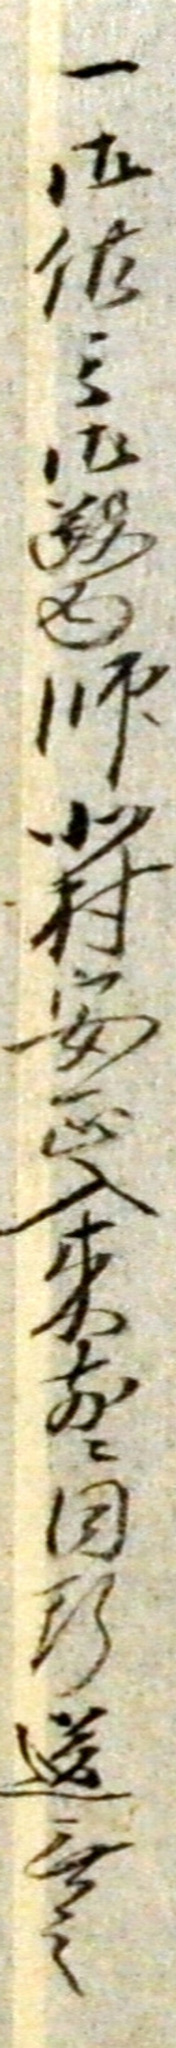一御供之御医師北村安正入来前二同断送無之
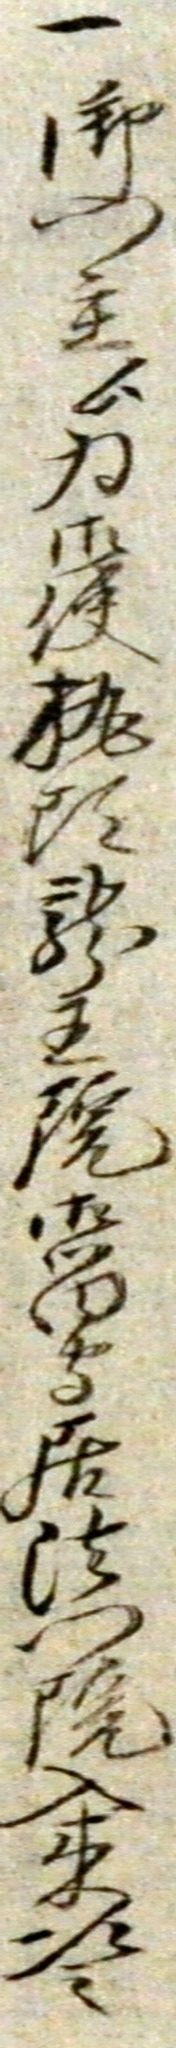一御門主ゟ為御使執頭龍王院御留守居法門院入来次之
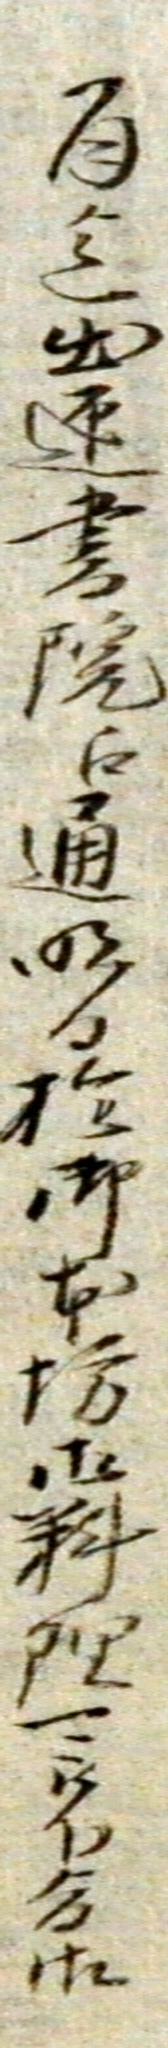間迄出迎書院江通明日於御本坊御料可被下旨御
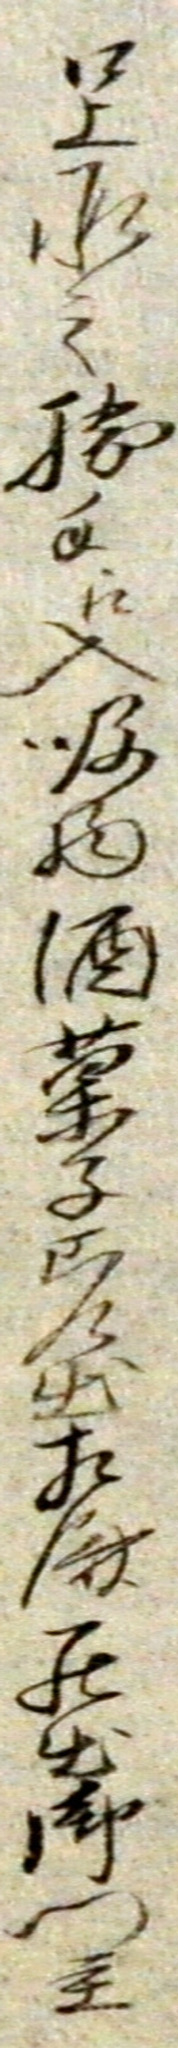口上承之勝手江入吸物酒菓子差出相済罷出御門主
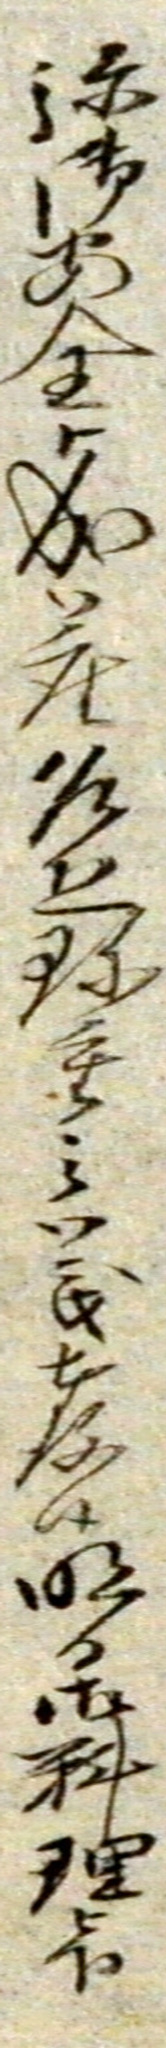弥御安全ヒ成御座乍上珍重之御義奉存候明日御料理ヒ下
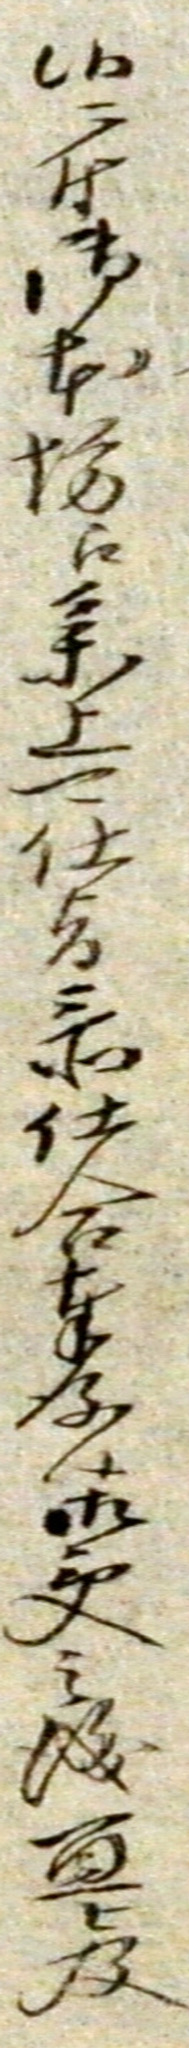候ニ付御本坊江参上可仕旨忝仕合奉存候御受之儀宜ヒ及
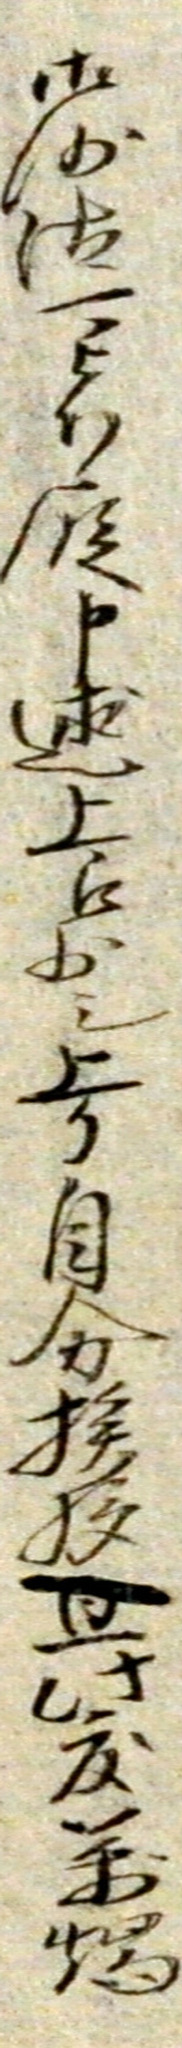御沙汰可ヒ下候段申述上江少し上り自分挨拶且此度萬端
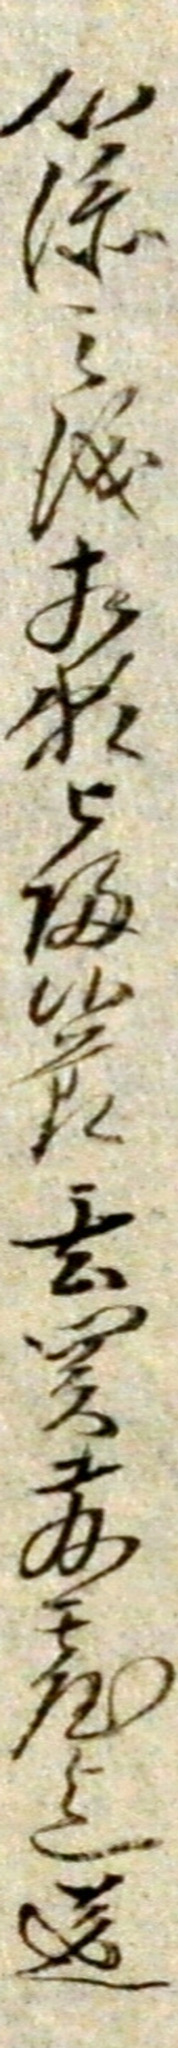心添之儀相頼ヒ帰候節玄関敷臺迄送
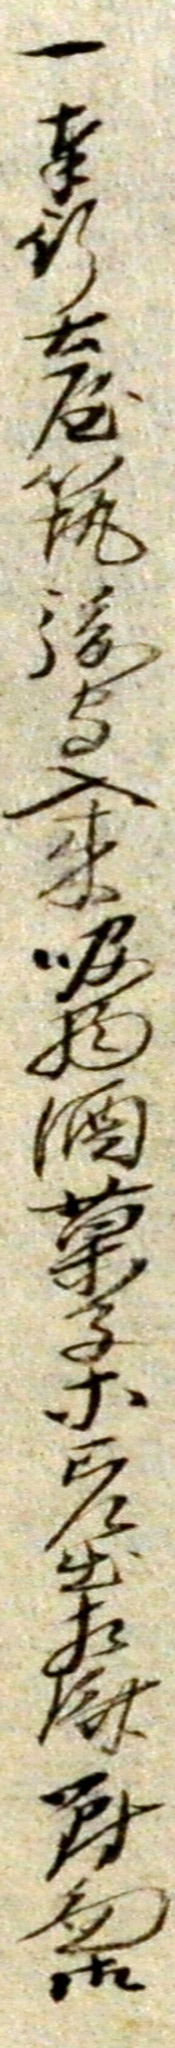一奉行土屋筑後守入来吸物酒菓子抔差出相済対面御
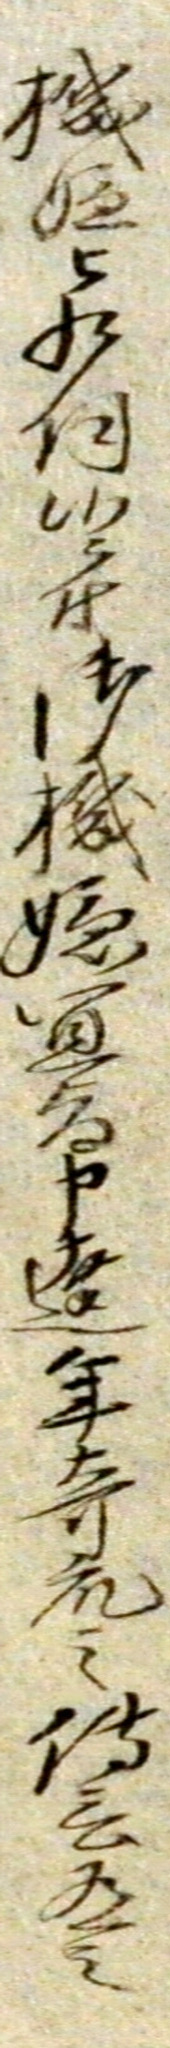機嫌ヒ相伺候ニ付御機嫌宣旨申達年寄衆之伝言有之
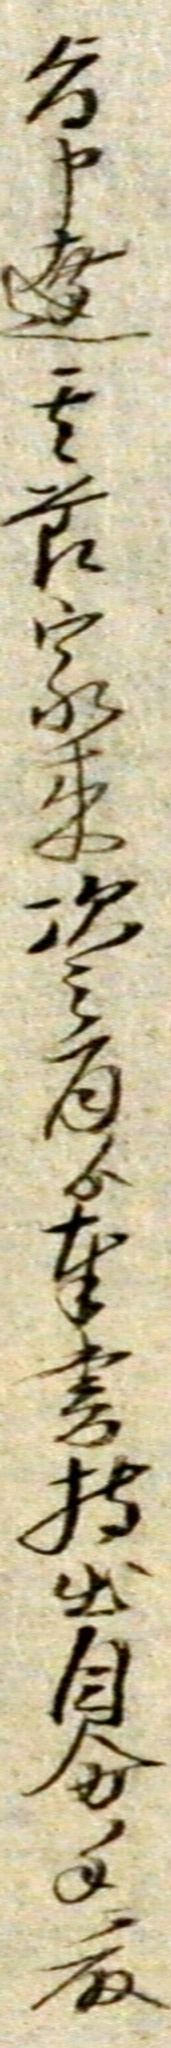旨申達其節家来次之間ゟ奉書持出自分手二取
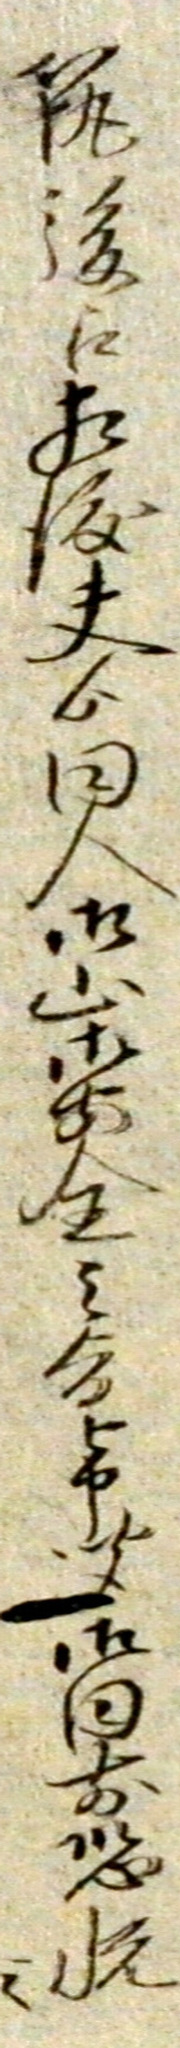筑後江相渡夫ゟ同人御山御安全之旨ヒ申聞御同前恐悦之
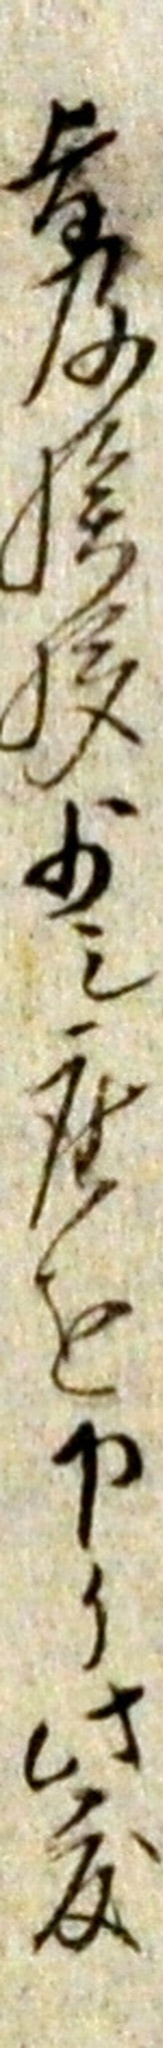旨及挨拶少し座を下り此度
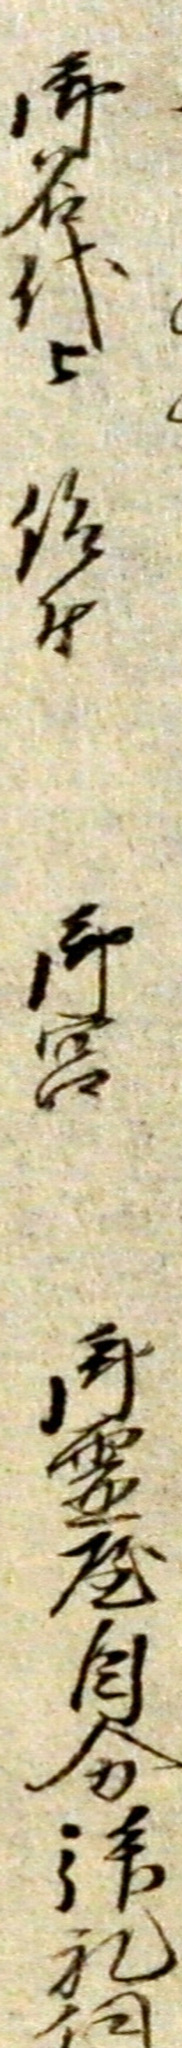御名代ヒ仰付御宮御霊屋自分拝礼伺
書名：日光御名代相勤候節ノ留
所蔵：伊那市立高遠町図書館・合同会社AMANE
